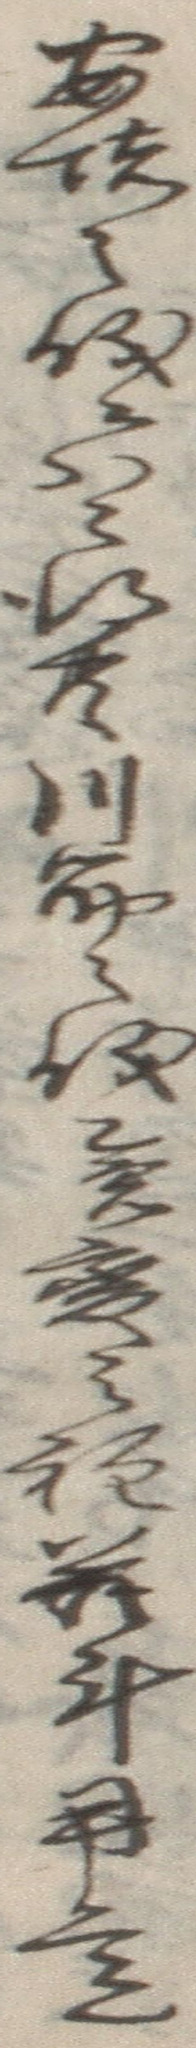安堵之儀二ハ候得共川筋之儀異変之程難計用意
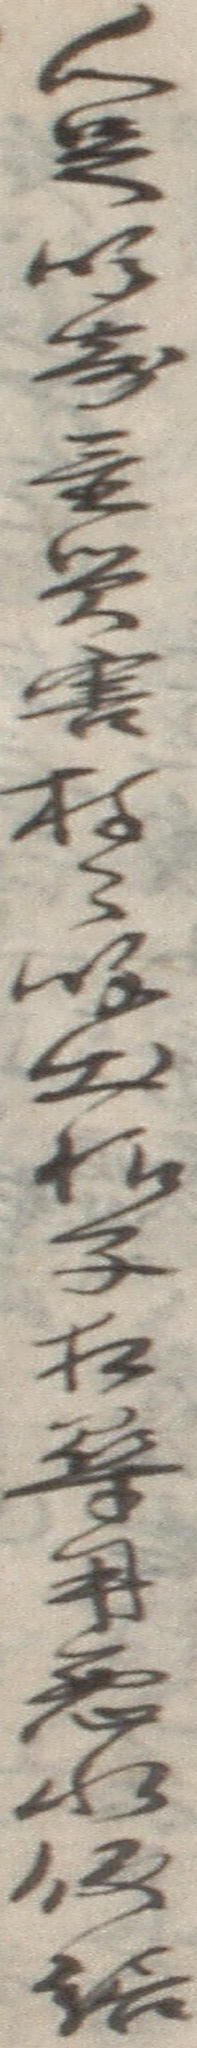人足呼寄置災害村々呼出様子相尋用悪水仮繕
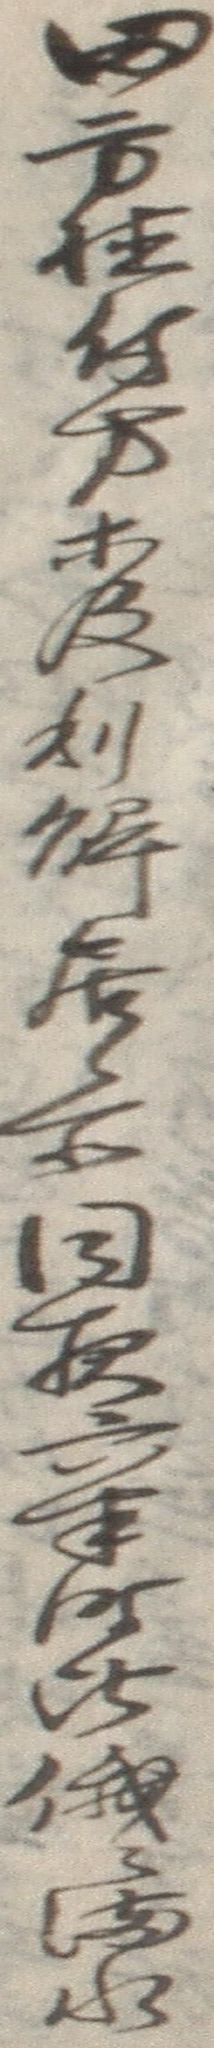田方植付方等及利解居候所同夜六半時比俄二満水
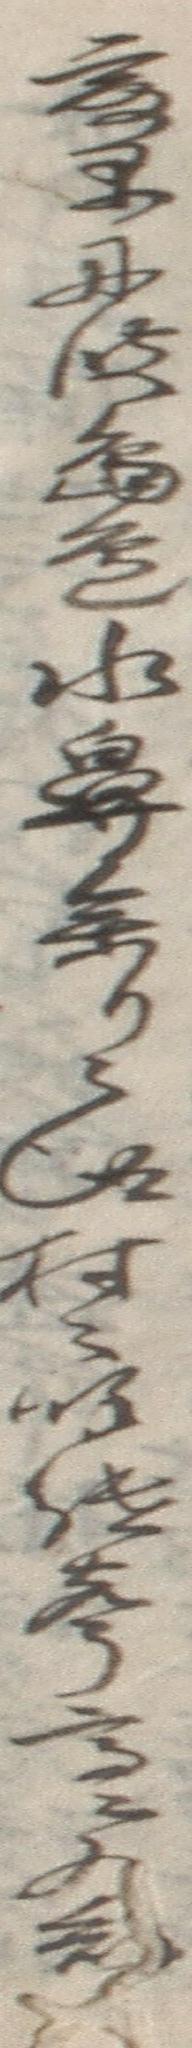最早丹波島辺水鼻参り候趣村々呼継声高二為知
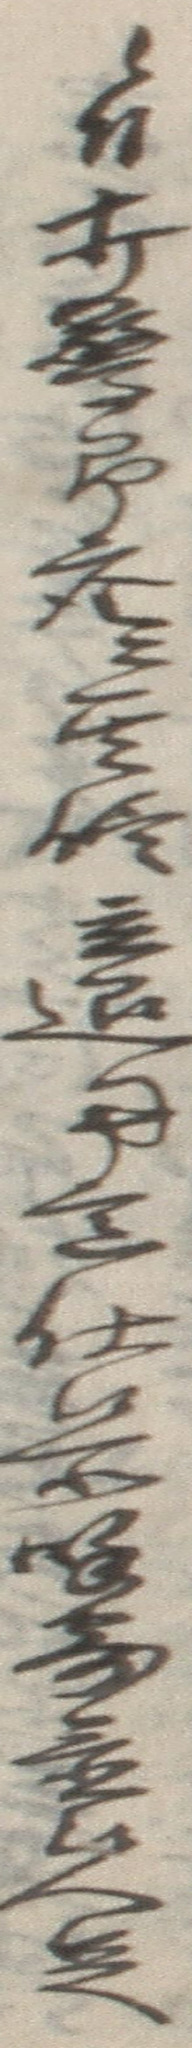候付打驚即座二其儘立退用意仕候所呼寄置候人足
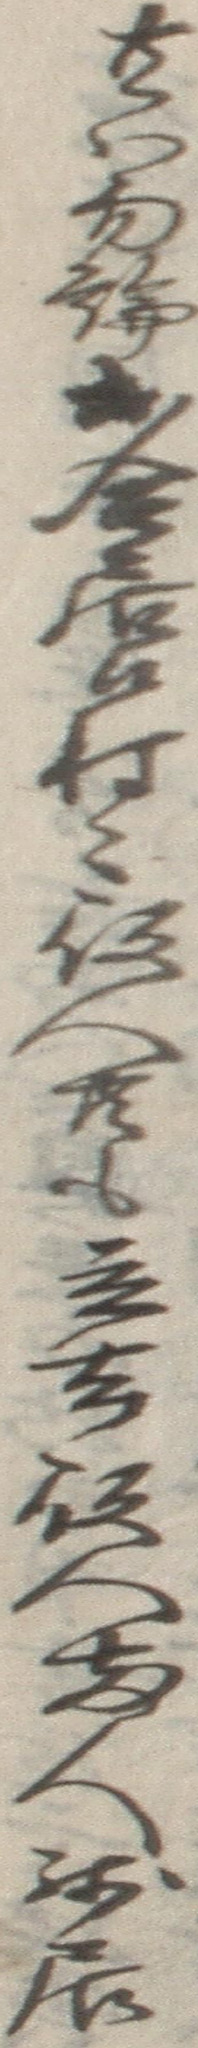共ハ勿論出合居候村々役人共も立去役人両人残居

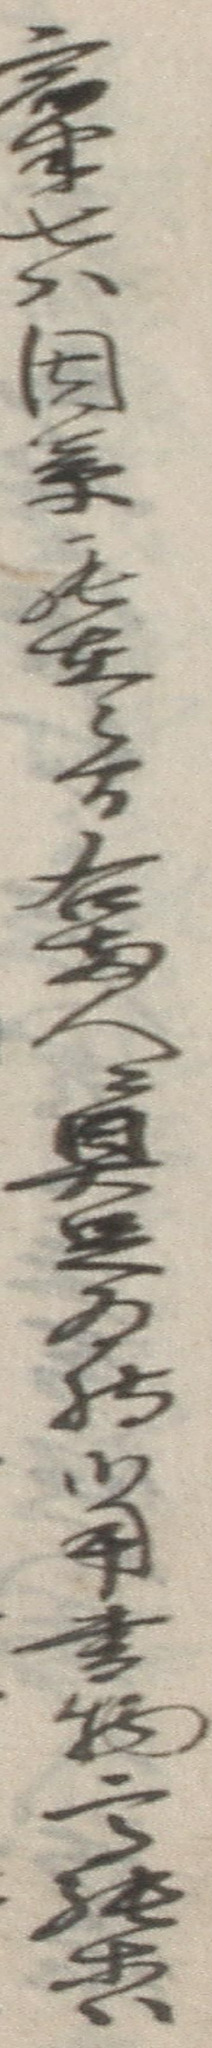宿半七ハ周章罷在候間右両人二具足為持御用書物高張等ハ
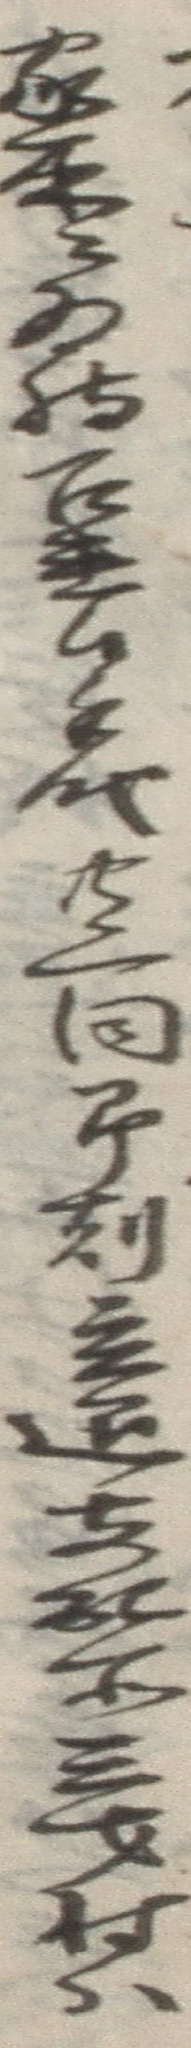家来二為持召連候手代共一同即刻立退支配所三才村ハ
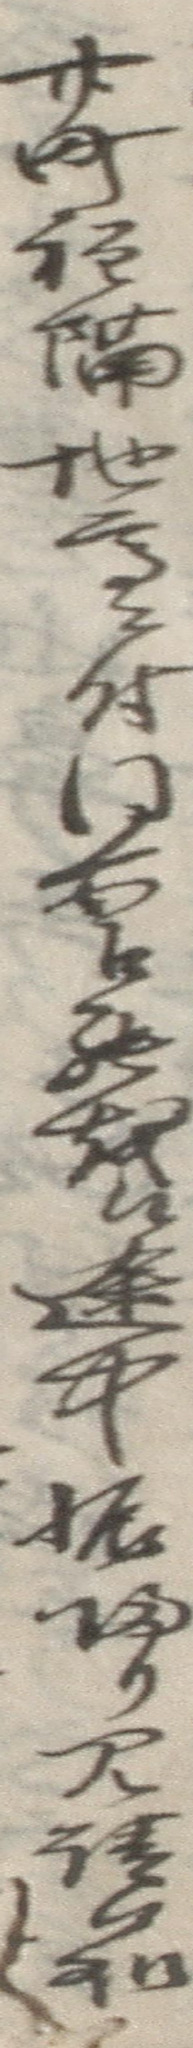廿町程隔地高二付同所江罷越候途中振帰り見請候処
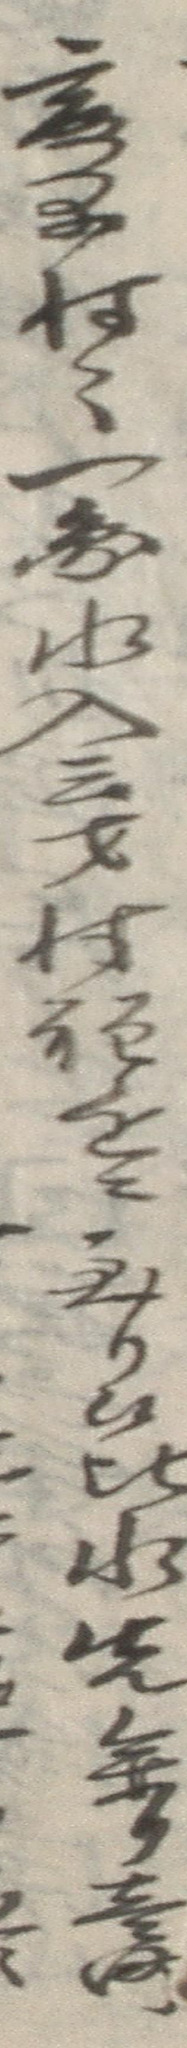最早村々一円水入三才村程近二至候比水先参り壱町
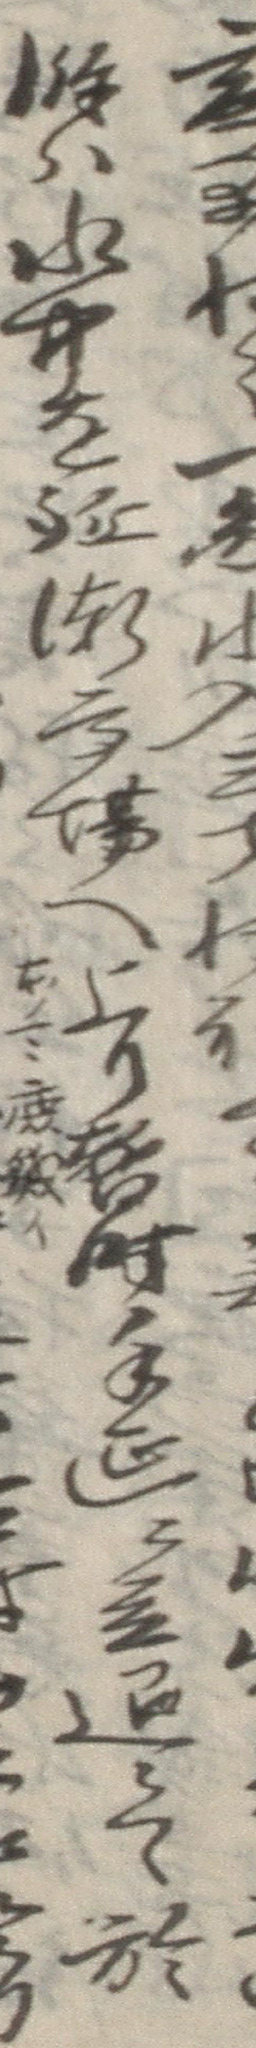餘ハ水中を駆漸高場へ上り暫時手近二立通候ハゝ於
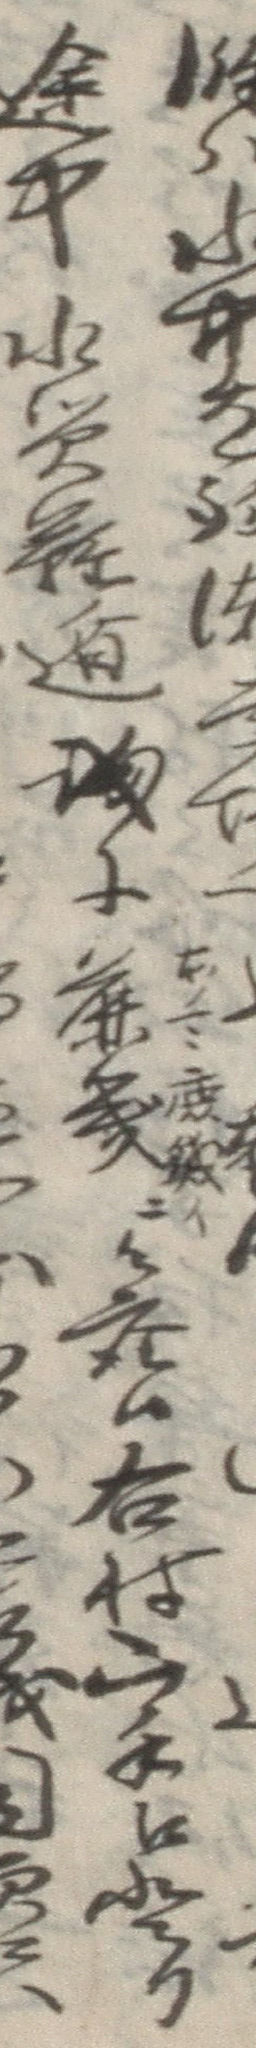途中水災難遁誠に廉義二御座候右村山手江登り
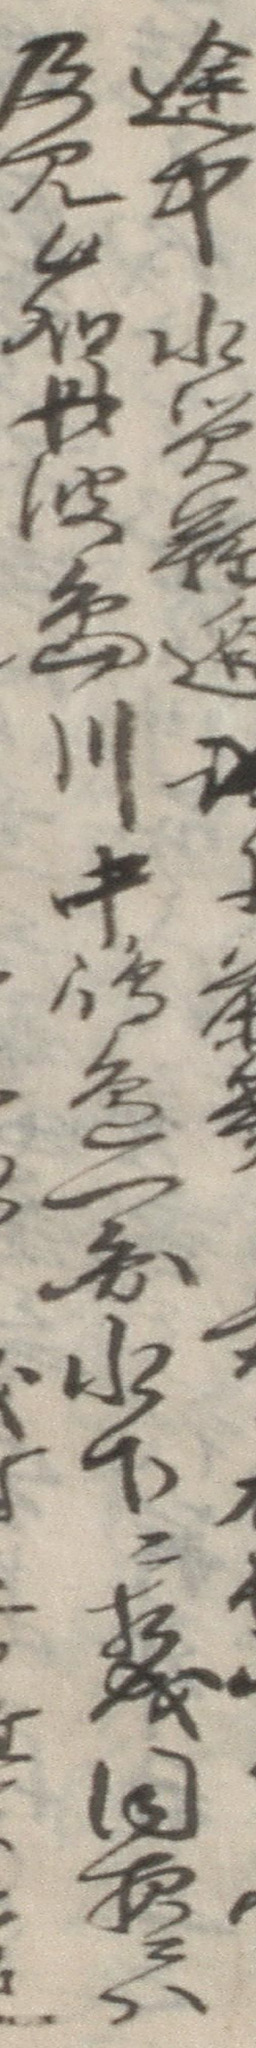及見候処丹波島川中嶋辺一円水下二相成同様二ハ
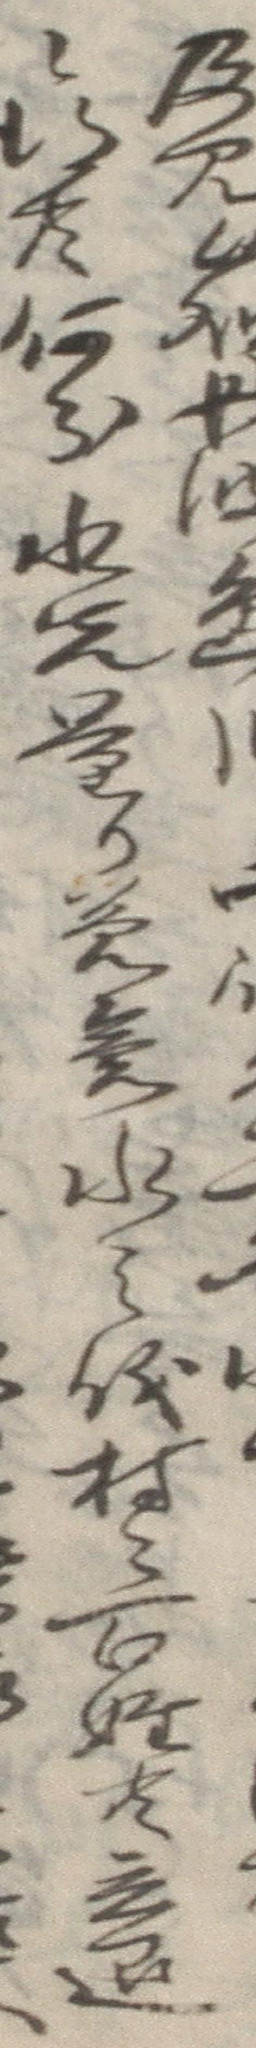候得共何分水先量兼急水之儀村々之百姓共立退
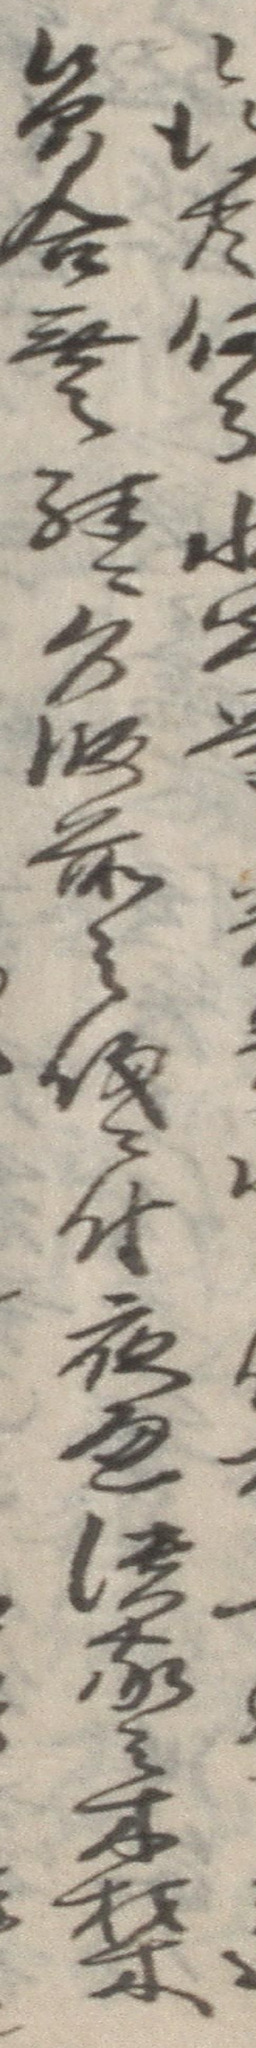候間合無之殊二夕飯前之儀二付夜通潰家之木材木
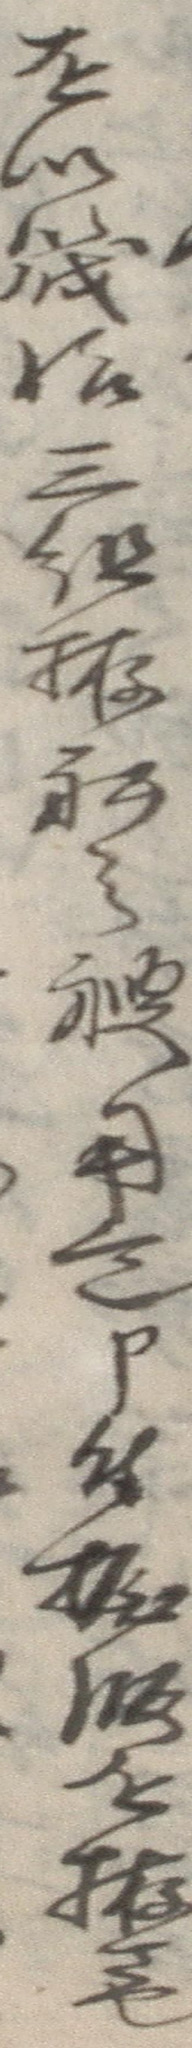を以筏様三組拵船之艘用意申付携飯を拵させ
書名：信州地震一件
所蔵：東京大学地震研究所図書室 Earthquake Research Institute Library, The University of Tokyo, JAPAN
